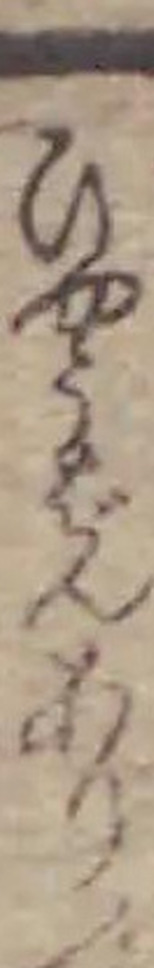ひやうばんあり
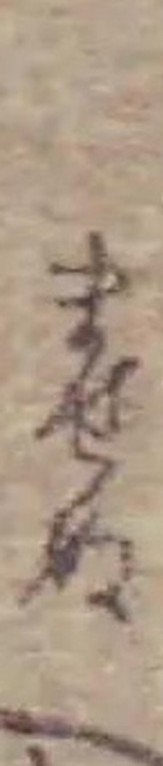ませぬ
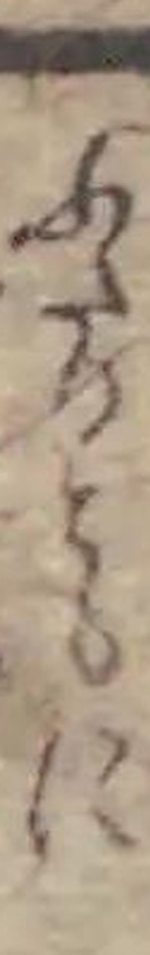ふたりともに
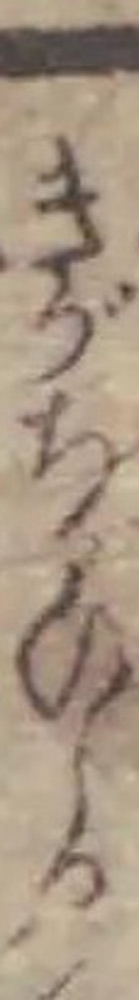きがちがひしか
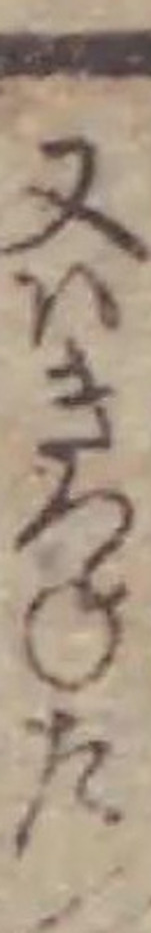又はきつねた
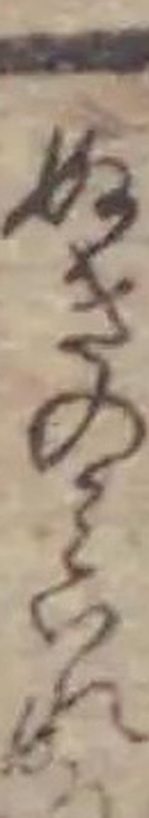ぬきのみいれか
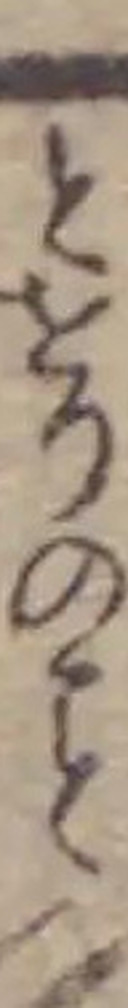とをりのこと
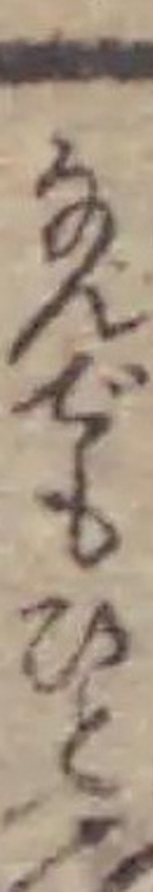なんでもひと
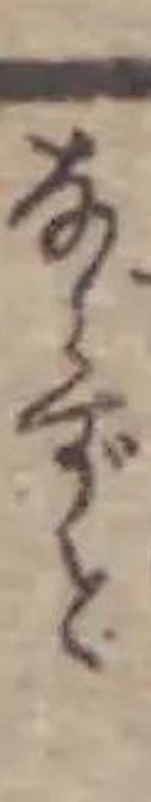ならずと
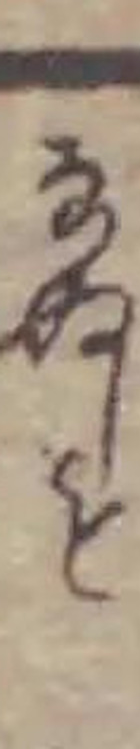なぬしを
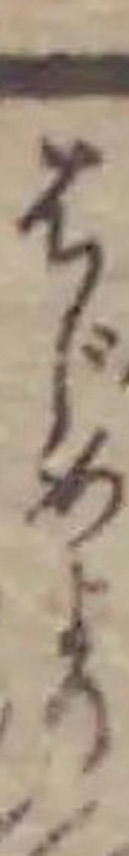はじめより
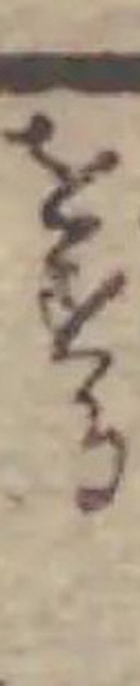をする
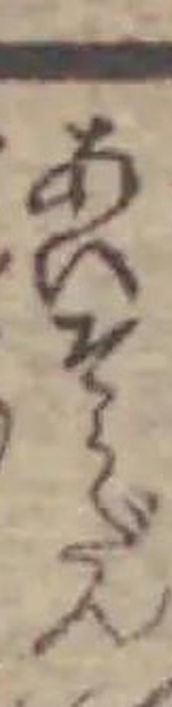あいそうだん
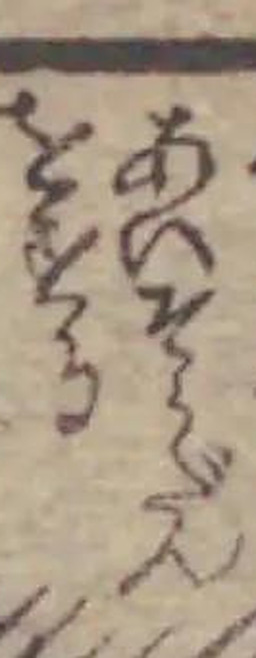をする
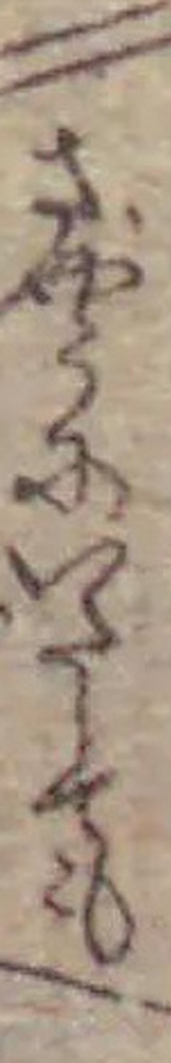さやふにいたしても
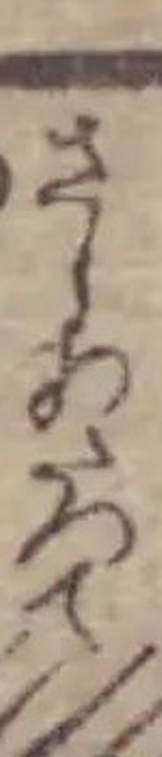さしあたつて
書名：飛た間違矢口噂 2巻
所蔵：国立国会図書館 National Diet Library, JAPAN
